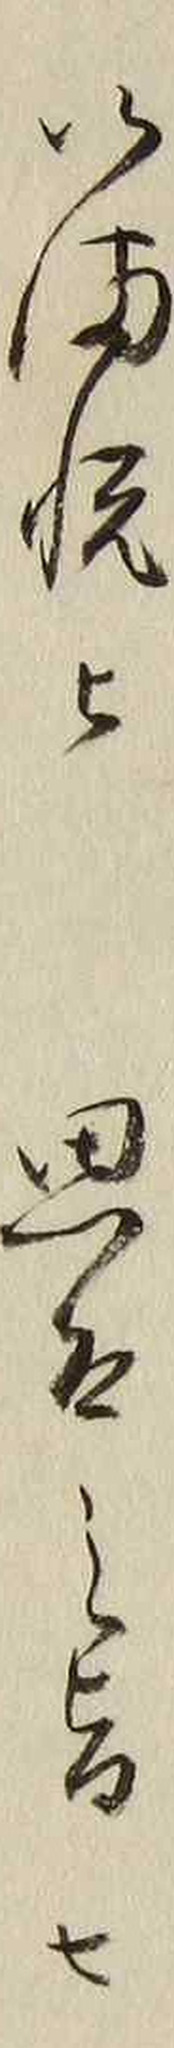御満悦被思召之間被
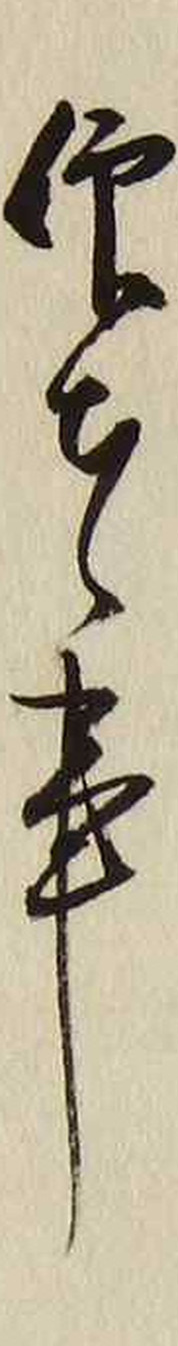仰出候事
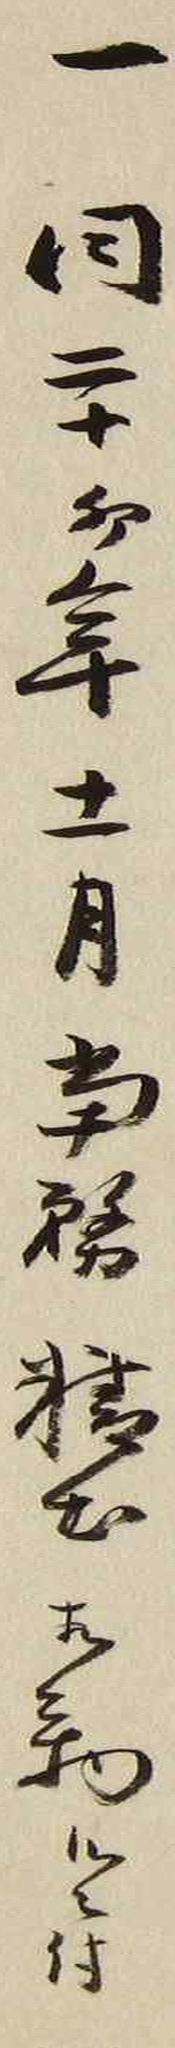一同二十卯年十一月当務精出相勤候に付
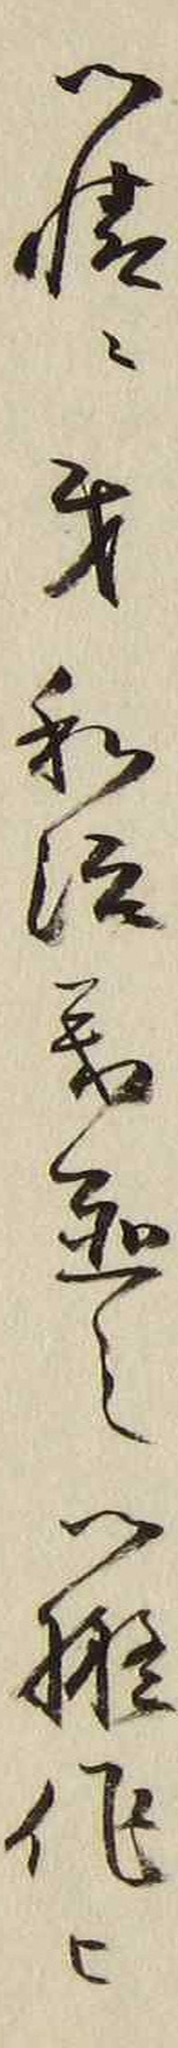御情に弟和治義懇之御擬作被

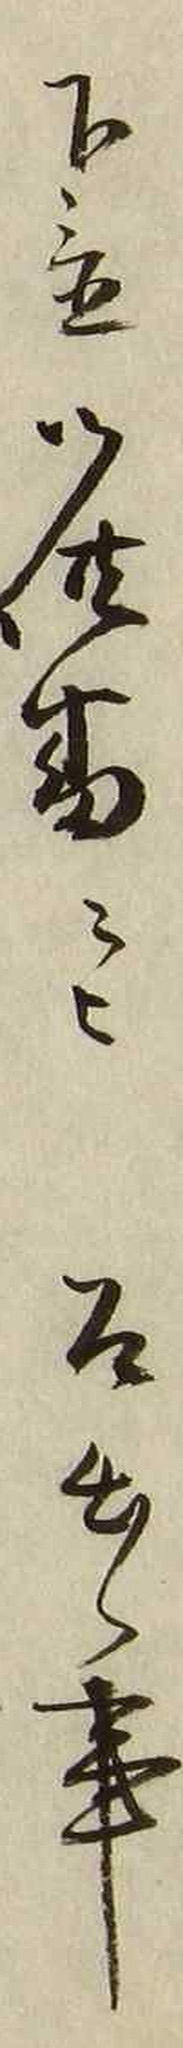被下置御供番に被召出候事
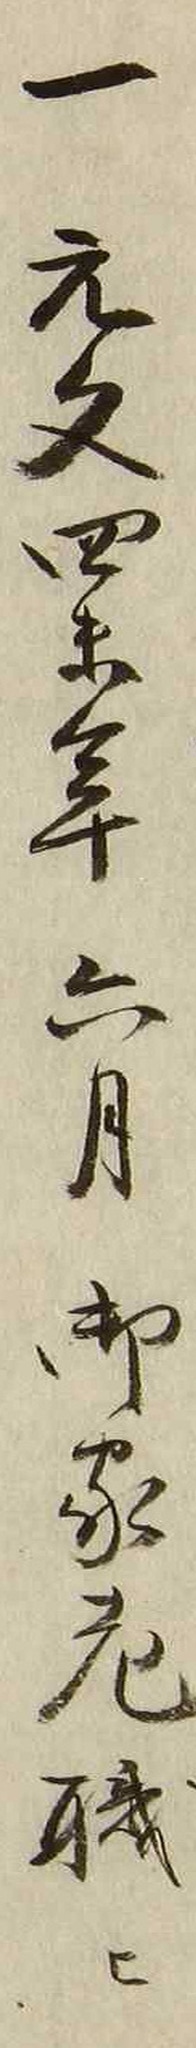一元文四未年六月御家老職被
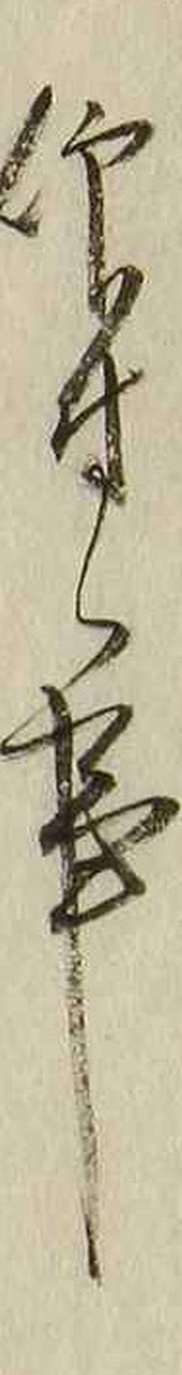仰付候事
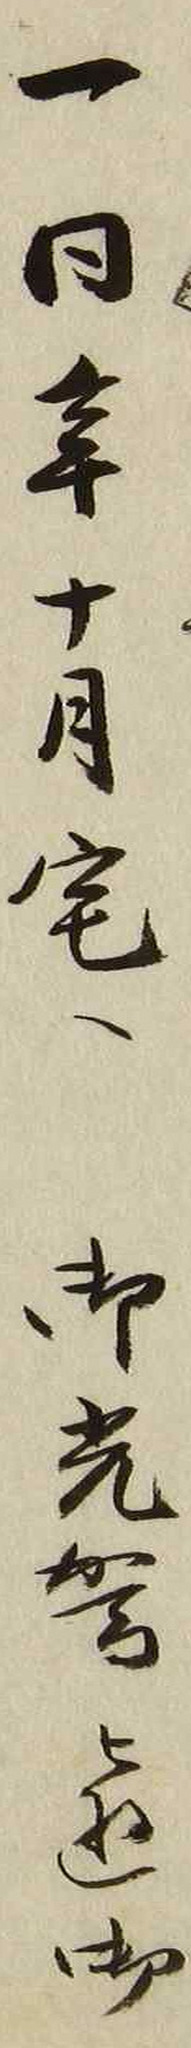一同年十月宅へ御光駕被遊御
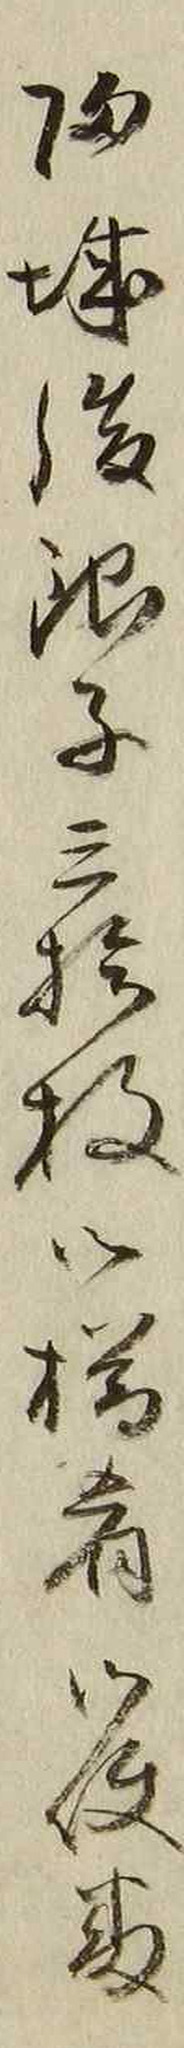帰城後銀子三拾枚御樽肴御使番
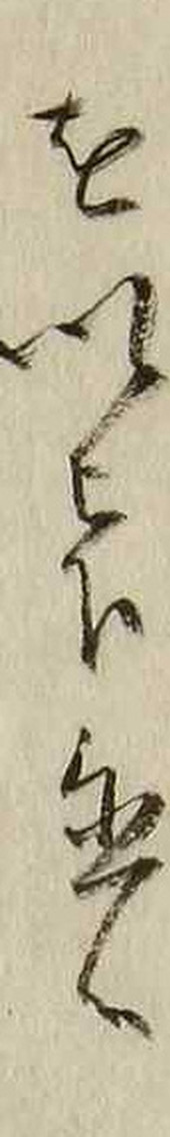を以被下置候事
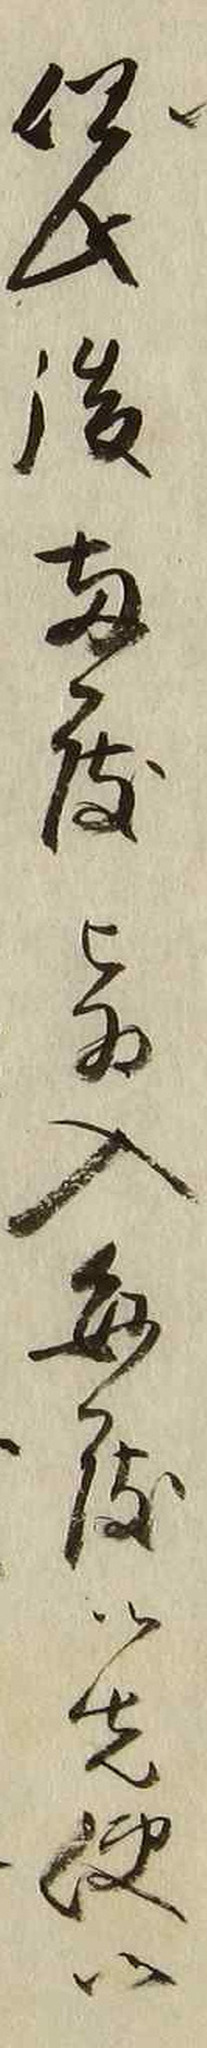但此後両度被為入毎度御先使御
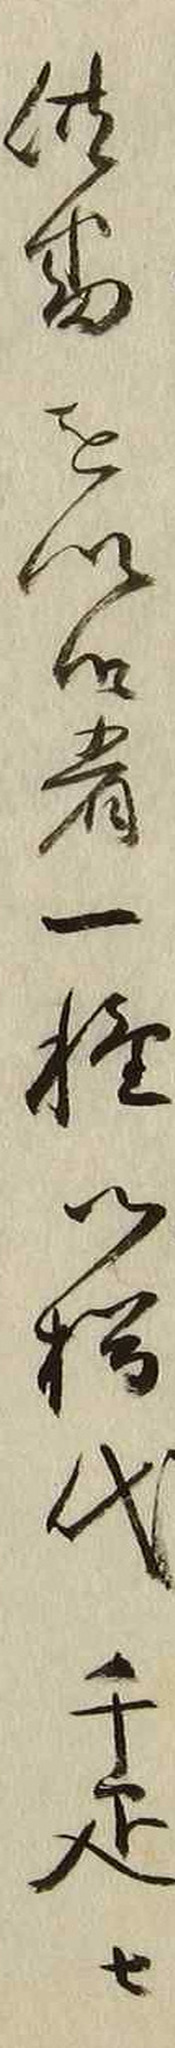供番を以御肴一種御樽代千疋被
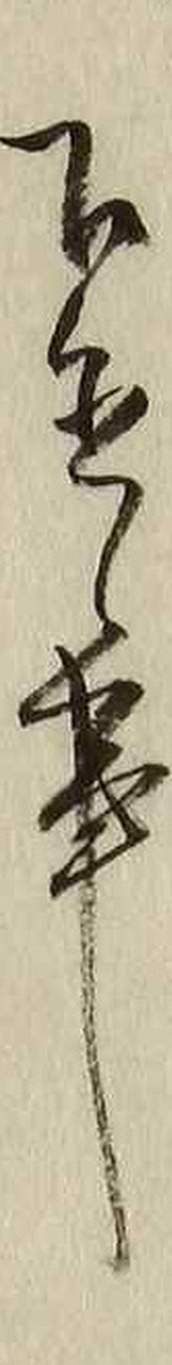下置候事
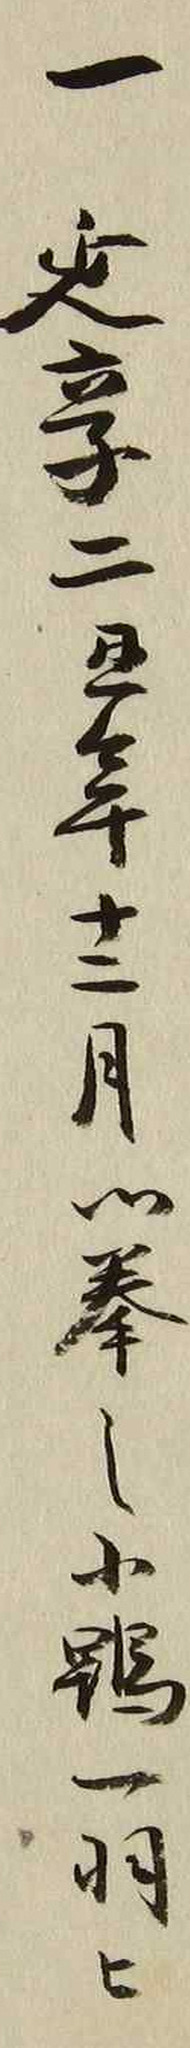一延享二丑年十二月御拳之小鴨一羽被
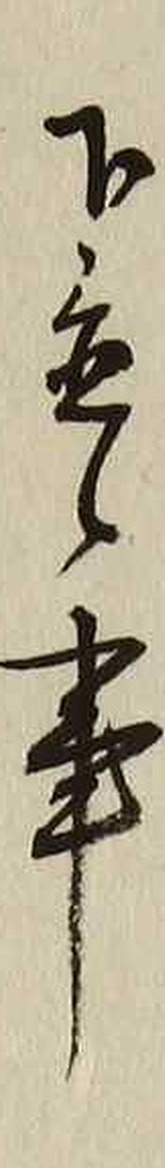下置候事
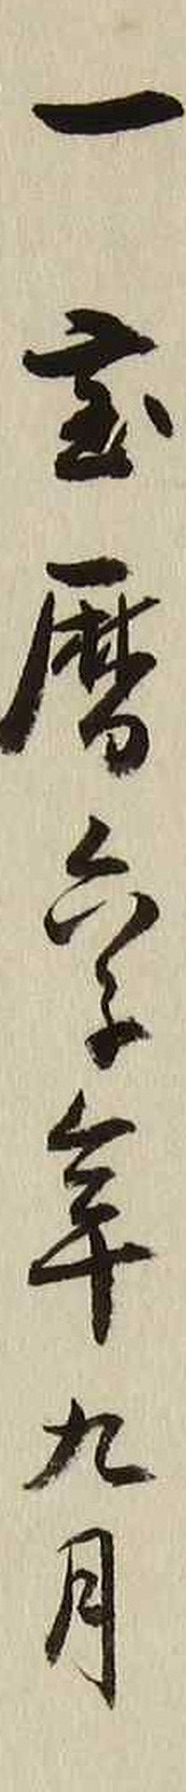一宝暦六子年九月
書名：諸士系譜　巻之292　き之部1
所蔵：会津若松市立会津図書館
